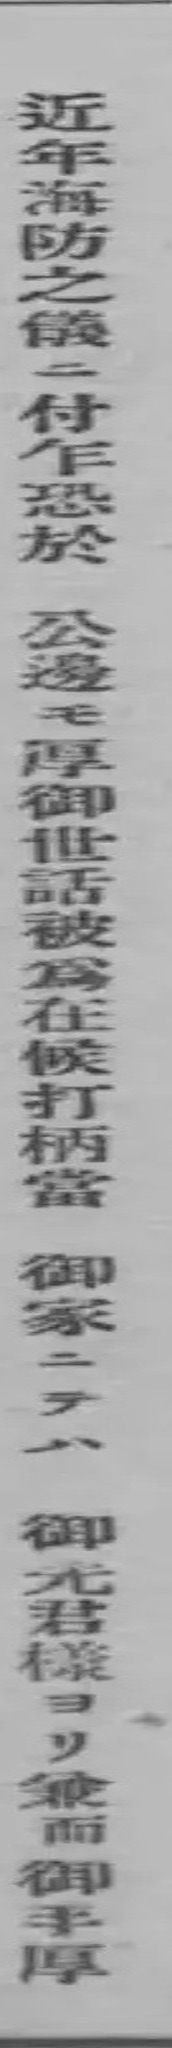近年海防之儀ニ付乍恐於公辺モ厚御世話被為在候打柄当御家ニテハ御元君様ヨリ兼而御手厚
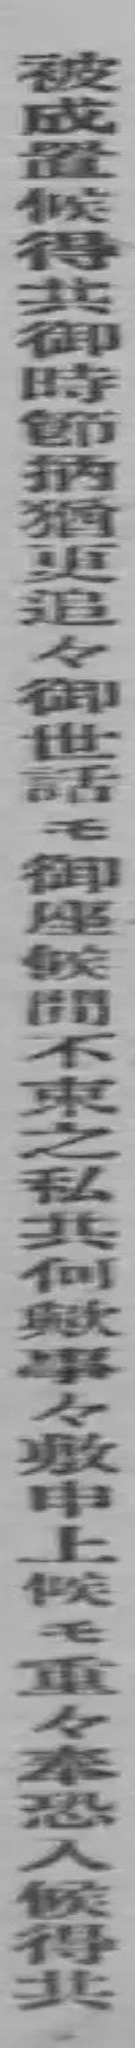被成置候得共御時節柄猶更追々御世話モ御座候間不束之私共何歟事々敷申上候モ重々奉恐入候得共

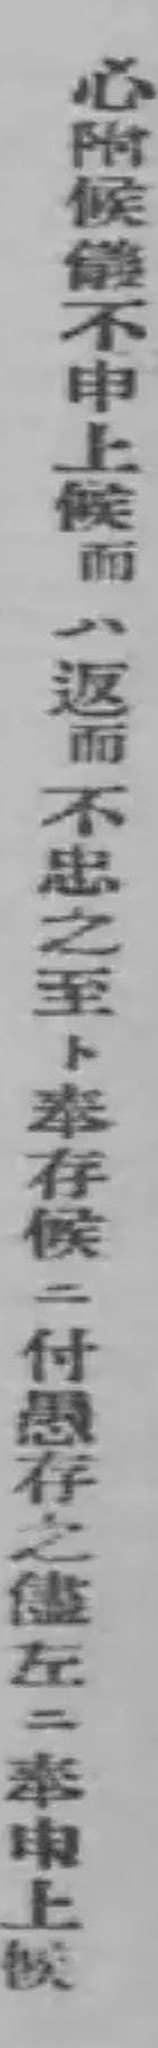心附候儀不申上候而ハ返而不忠之至ト奉存候ニ付愚存之侭左ニ奉申上候
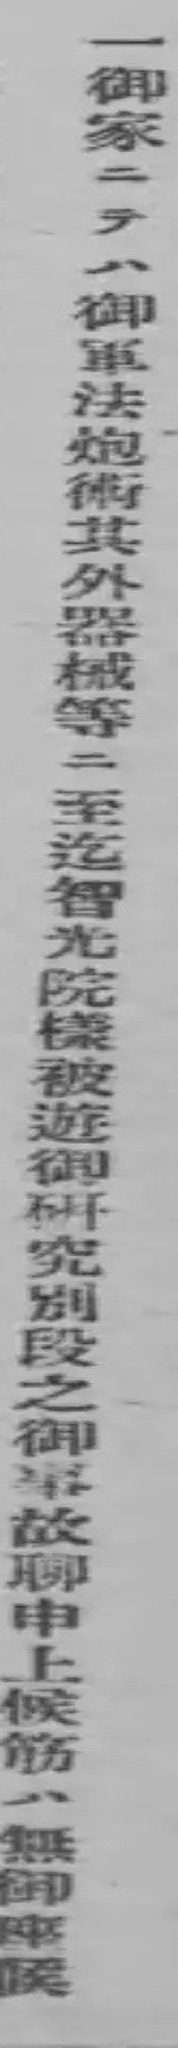一御家ニテハ御軍法炮術其外器械等ニ至迄智光院様被遊御研究別段之御事故聊申上候筋ハ無御座候
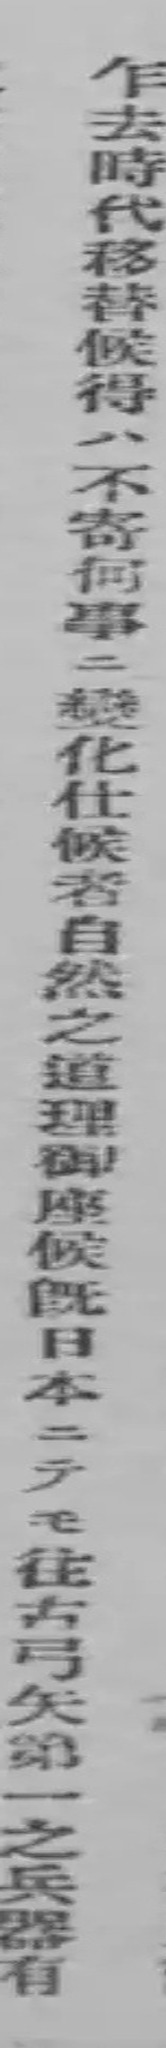乍去時代移替候得ハ不寄何事ニ変化仕候者自然之道理御座候既日本ニテモ往古弓矢第一之兵器有
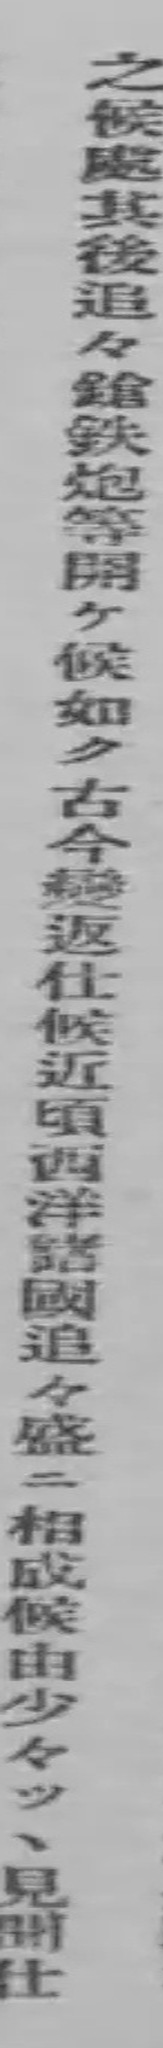之候処其後追々鑓鉄炮等開ケ候如ク古今変返仕候近頃西洋諸国追々盛ニ相成候由少々ツヽ見聞仕
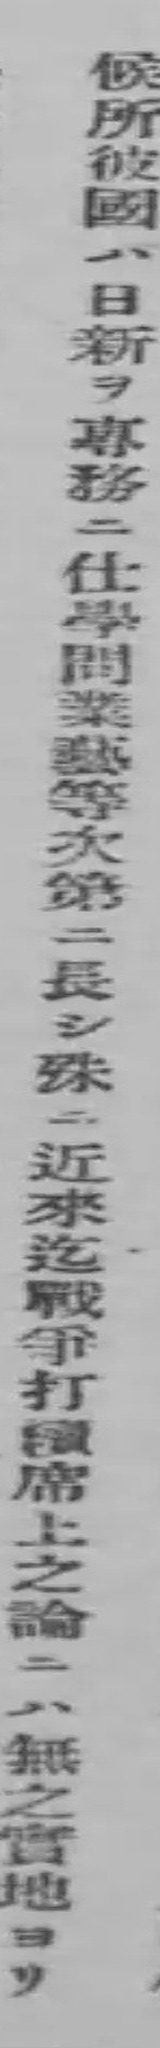候所彼国ハ日新ヲ専務ニ仕学問業芸等次第ニ長シ殊ニ近来迄戦争打続席上之論ニハ無之実地ヨリ
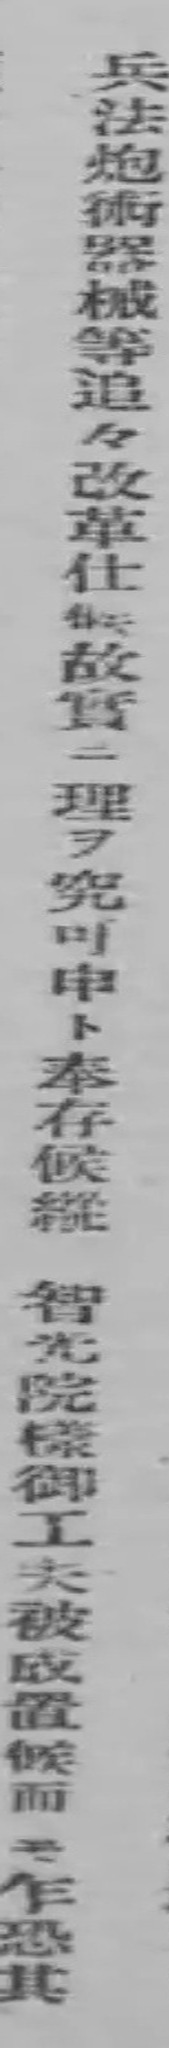兵法炮術器械等追々改革仕候故実ニ理ヲ究可申ト奉存候縦智光院様御工夫被成置候而モ乍恐其
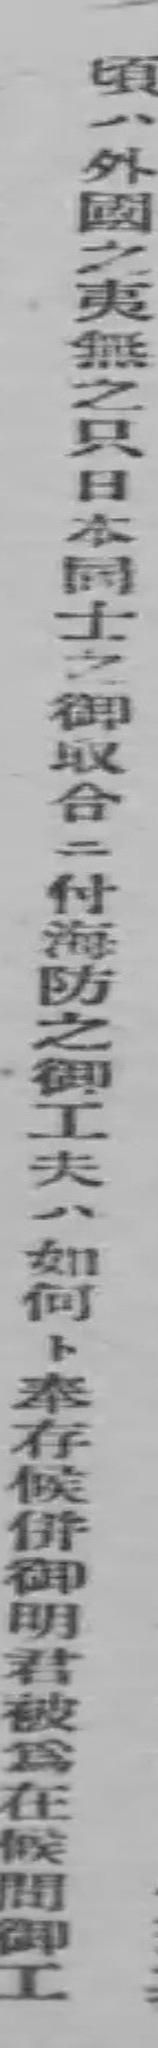頃ハ外国之夷無之只日本同士之御取合ニ付海防之御工夫ハ如何ト奉存候併御明君被為在候間御工
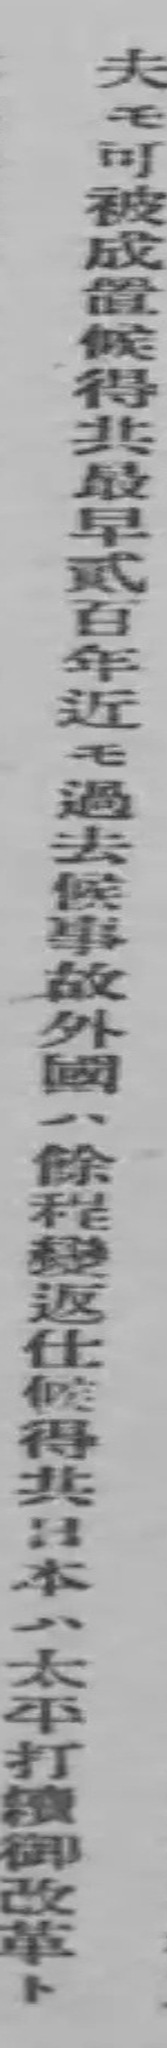夫モ可被成置候得共最早弐百年近モ過去候事故外国ハ余程変返仕候得共日本ハ太平打続御改革ト
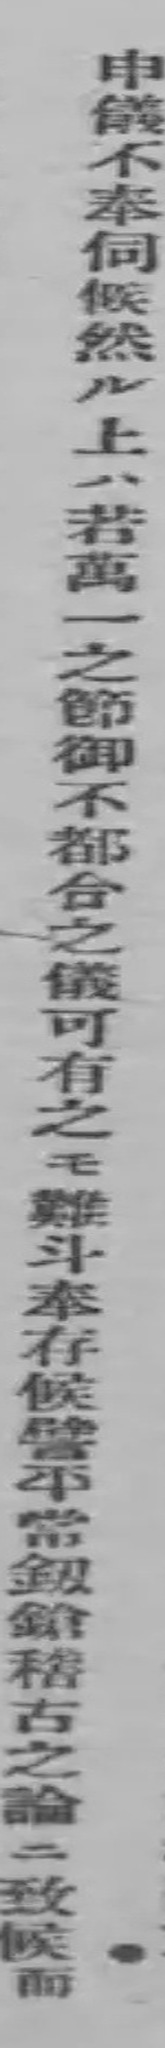申儀不奉伺候然ル上ハ若万一之節御不都合之儀可有之モ難斗奉存候譬平常釼鑓稽古之論ニ致候而
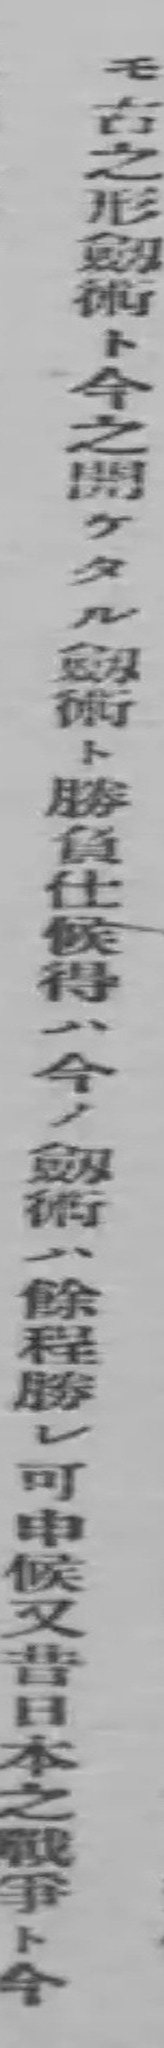モ古之形釼術ト今之開ケタル釼術ト勝負仕候得ハ今ノ釼術ハ余程勝レ可申候又昔日本之戦争ト今
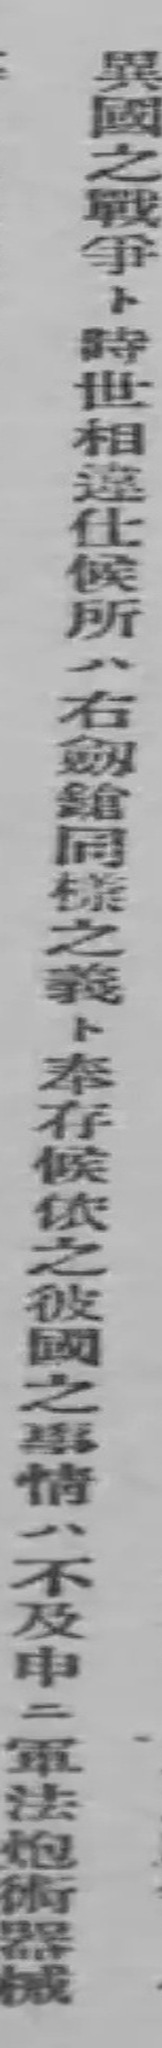異国之戦争ト時世相違仕候所ハ右釼鑓同様之義ト奉存候依之彼国之事情ハ不及申ニ軍法炮術器械
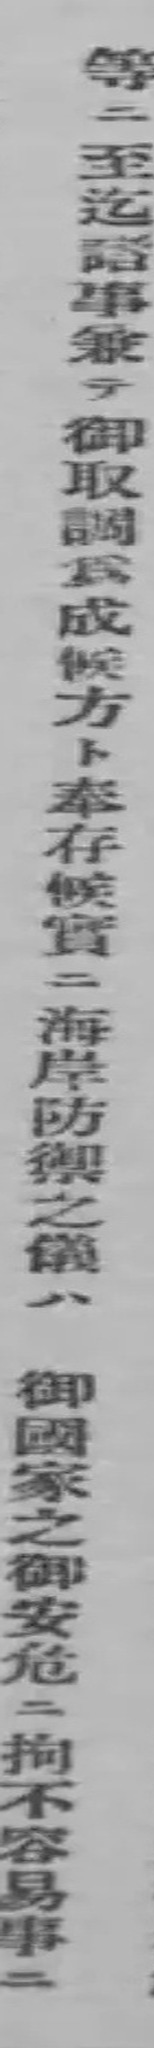等ニ至迄諸事兼テ御取調為成候方ト奉存候実ニ海岸防禦之儀ハ御国家之御安危ニ拘不容易事ニ
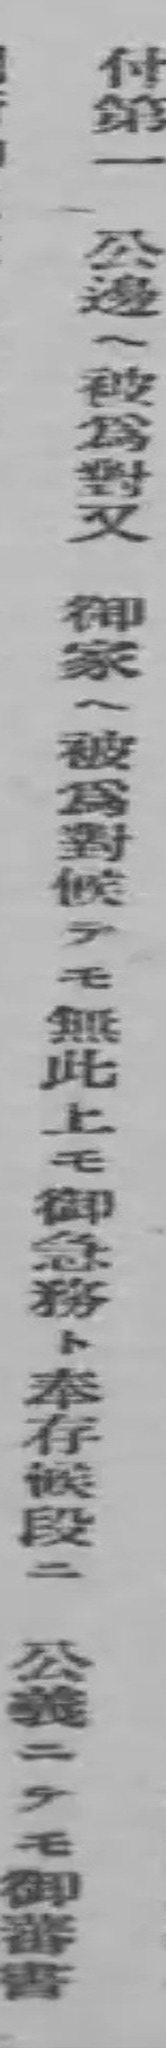付第一公辺ヘ被為対又御家ヘ被為対候テモ無此上モ御急務ト奉存候段ニ公義ニテモ御蕃書
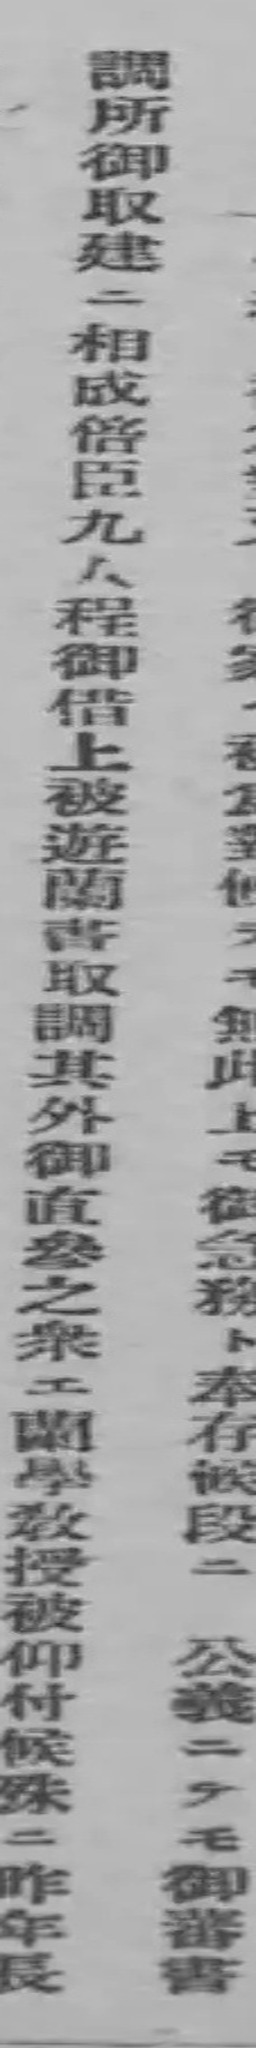調所御取建ニ相成陪臣九人程御借上被遊蘭書取調其外御直参之衆エ蘭学教授被仰付候殊ニ昨年長
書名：豊橋市史談
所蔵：国立国会図書館 National Diet Library, JAPAN
